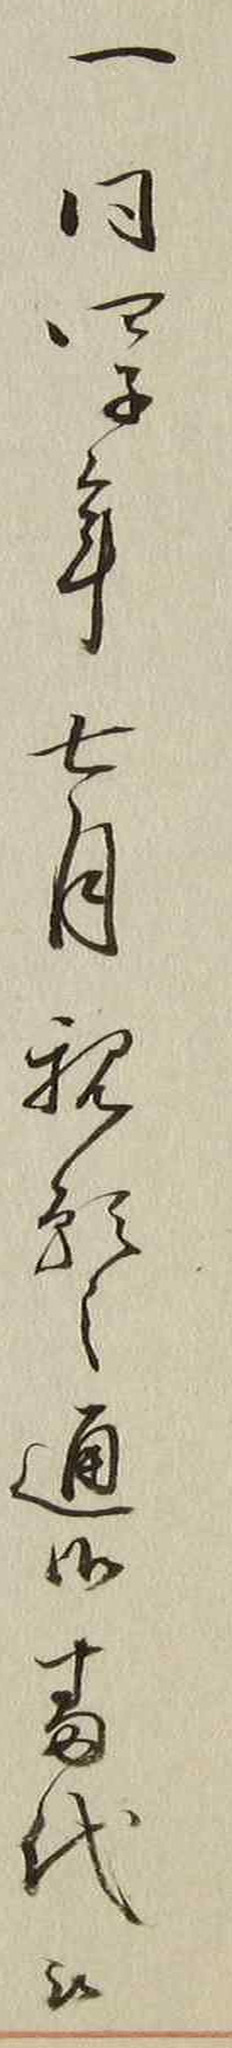一同四子年七月親願之通御番代被
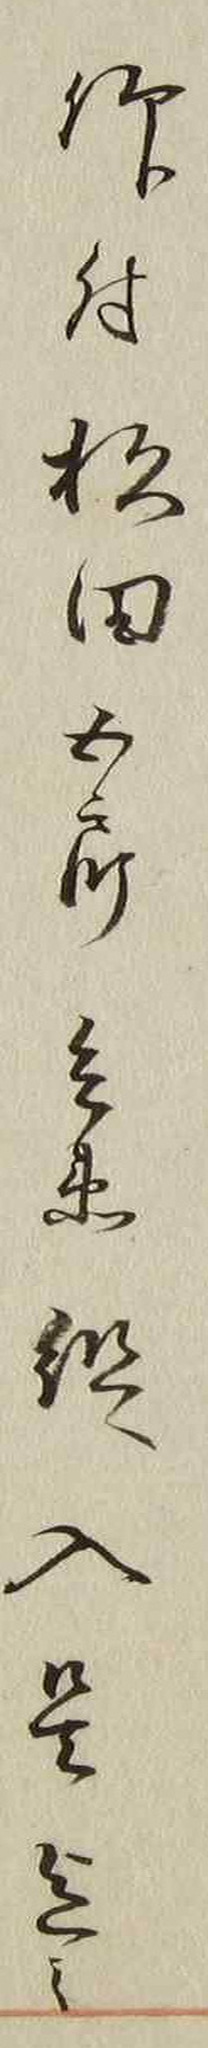仰付杉田五郎兵衛組へ入是迄之
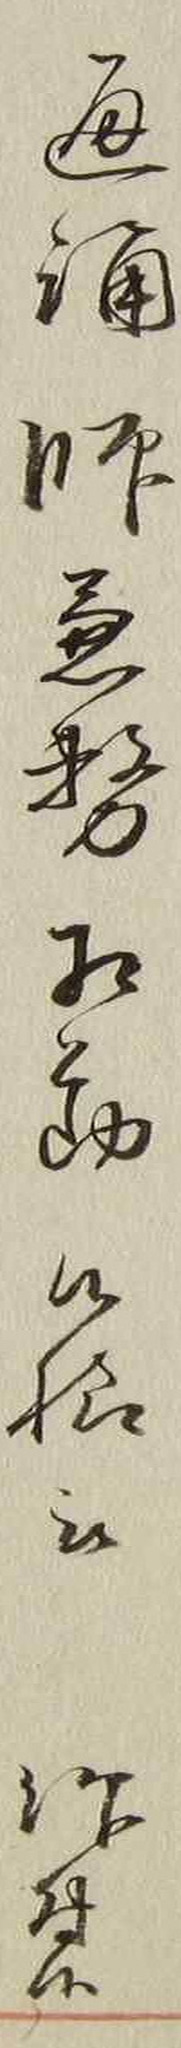通誦師兼務相勤候様被仰付候
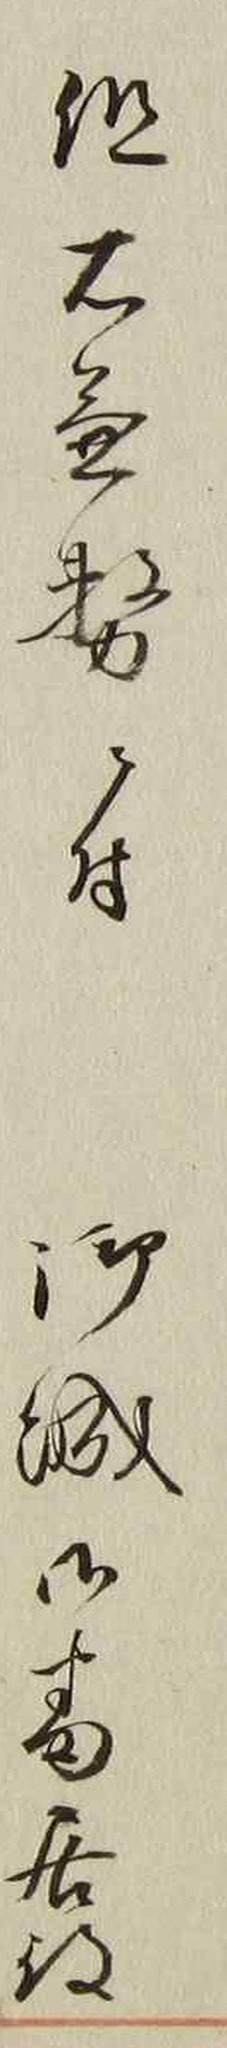但右兼務ニ付御城御番居役
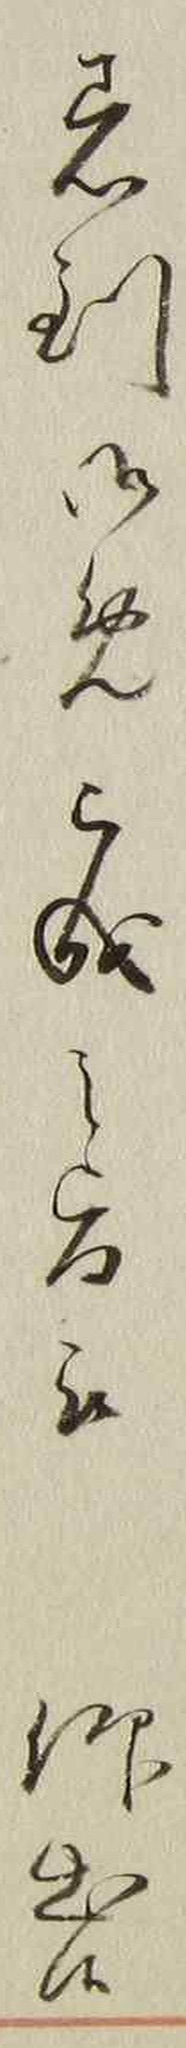着到御免被成之旨被仰出候
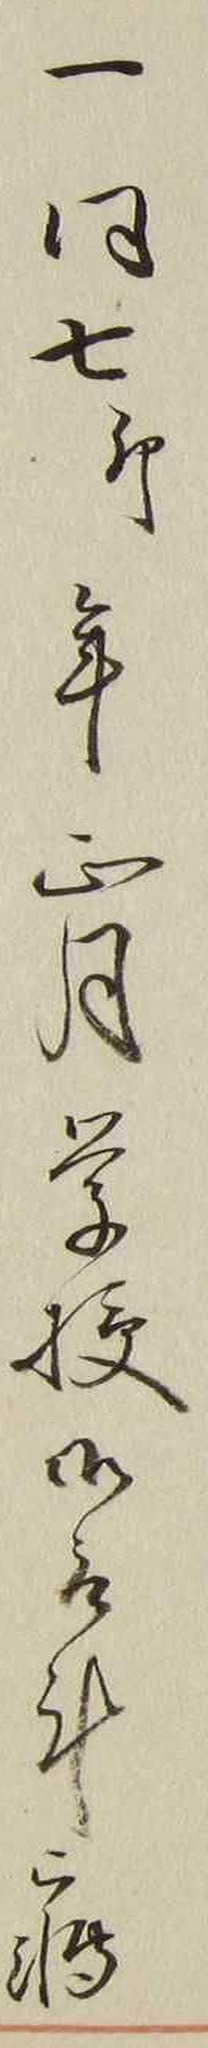一同七卯年正月学校御取計被転

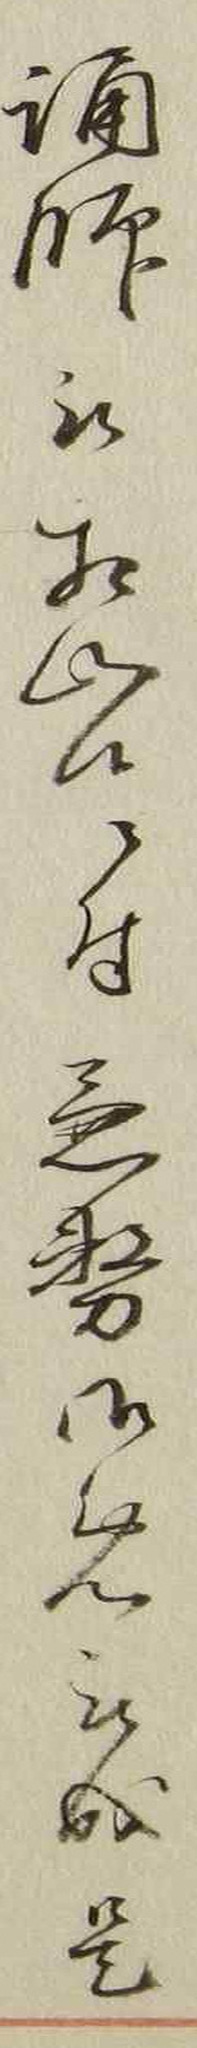誦師被相止候ニ付兼務御免被成是
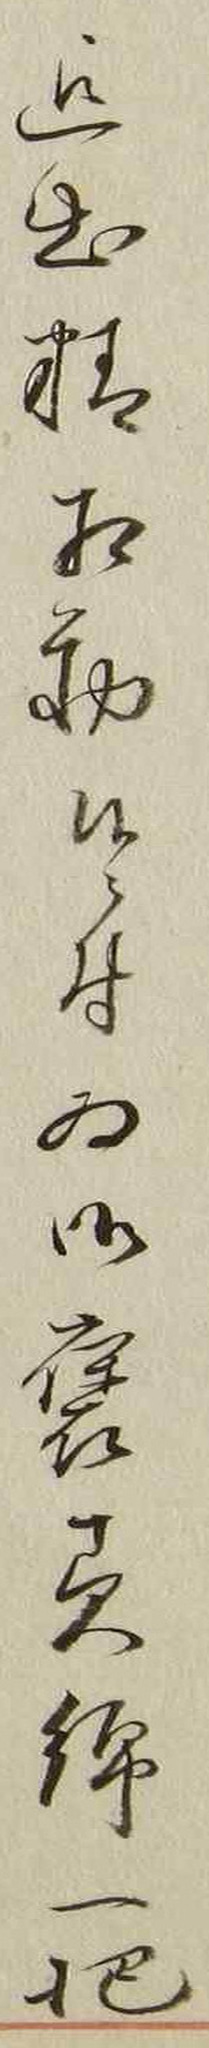迄出精相勤候ニ付為御褒美綿一把
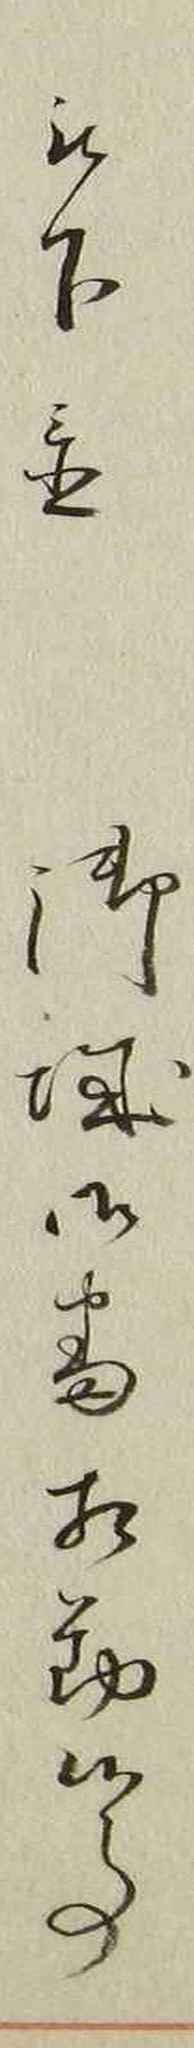被下置御城御番相勤候事
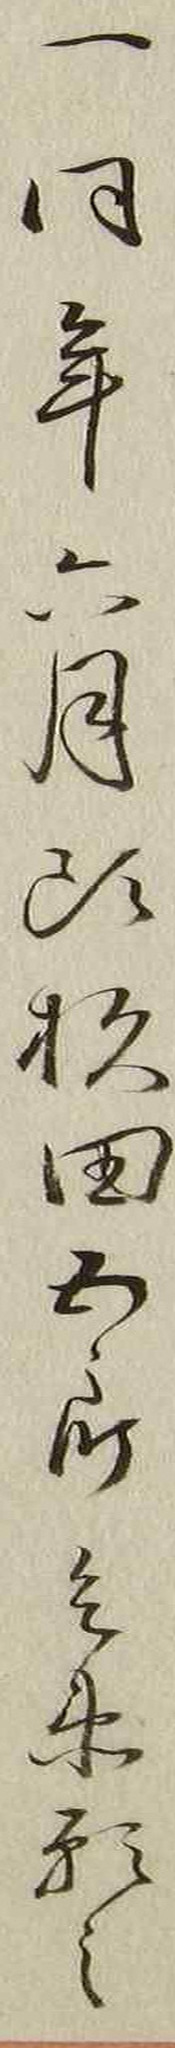一同年六月頭杉田五郎兵衛願之
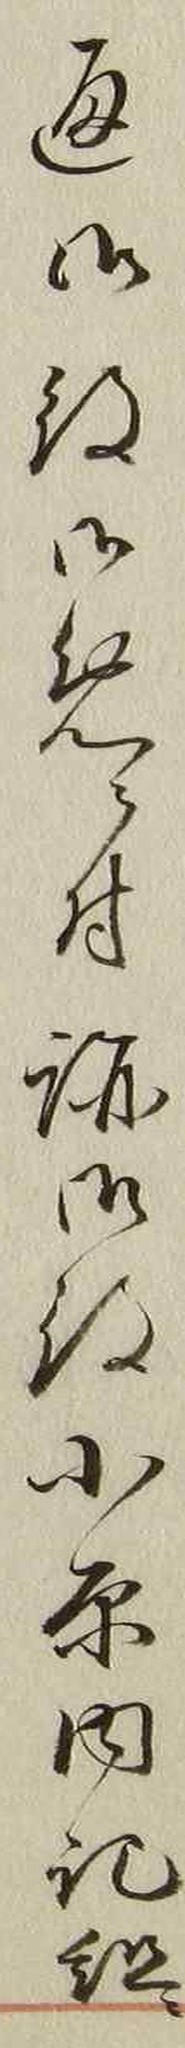通御役御免ニ付跡御役小原内記組ニ
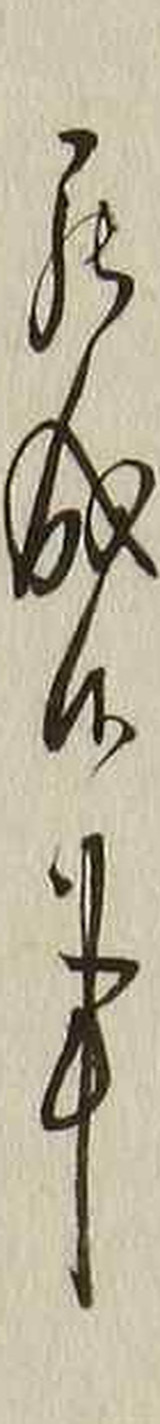罷成候事
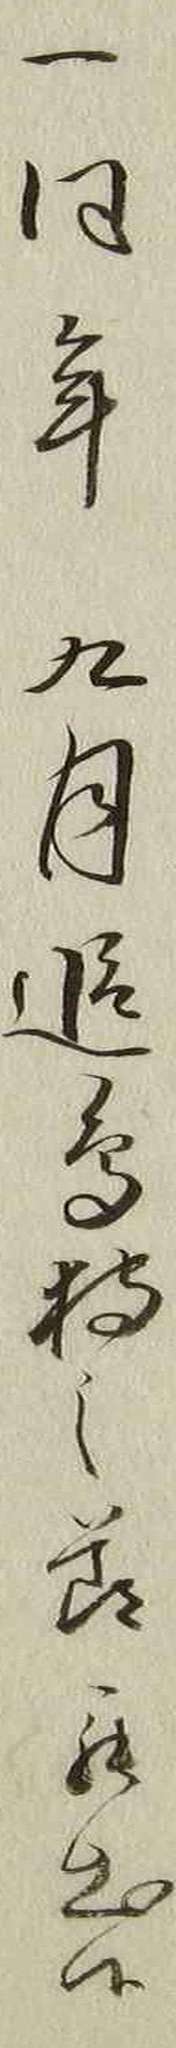一同年九月追鳥狩之節罷出候
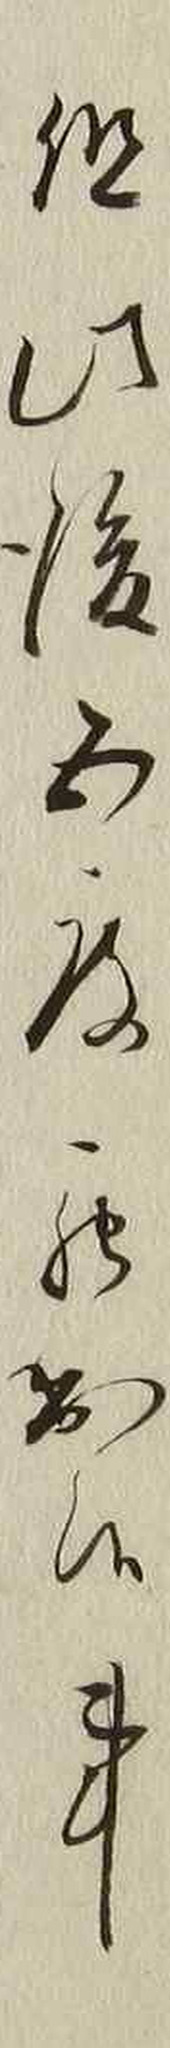但此後五度罷出候事
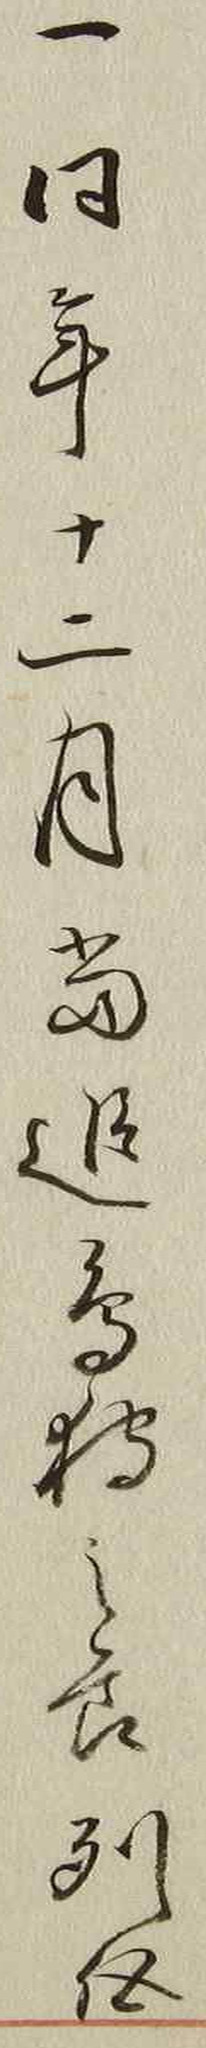一同年十二月当追鳥狩之節列伍
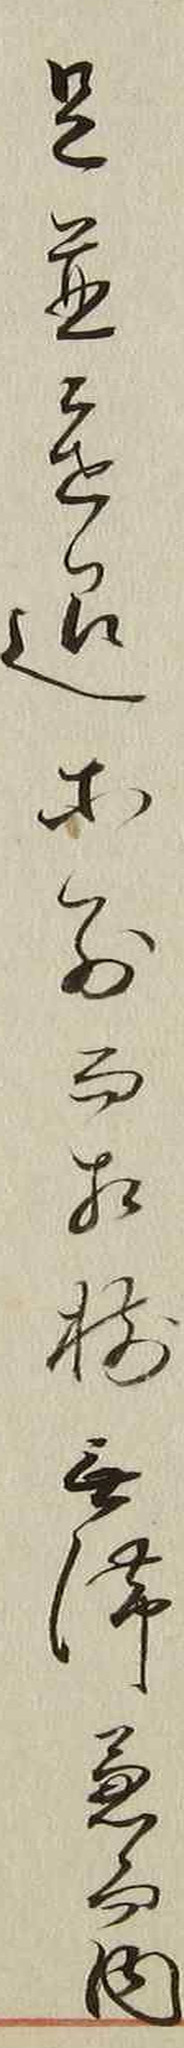足並進退等別而相揃無滞兼而内
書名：諸士系譜　巻之28　い之部28
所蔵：会津若松市立会津図書館
